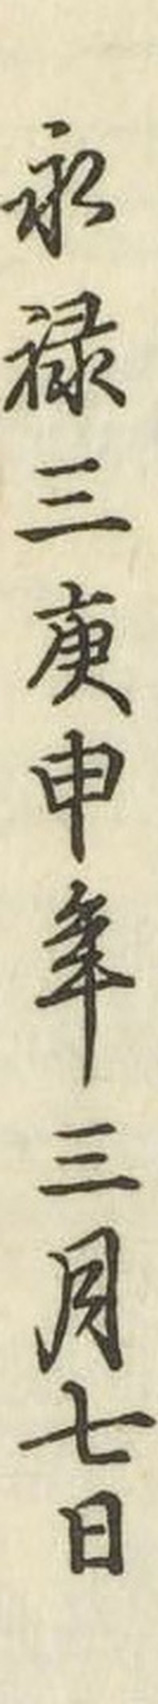永禄三庚申年三月七日
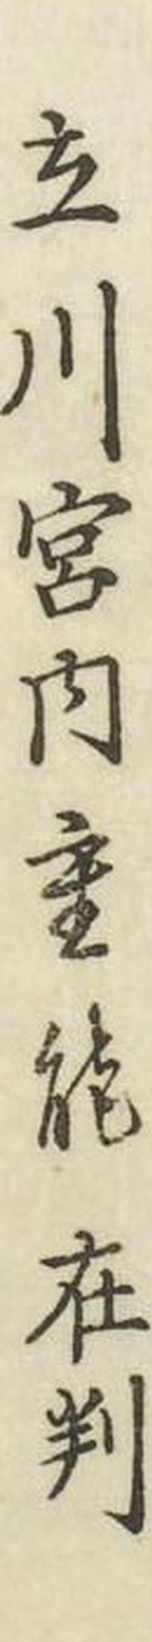立川宮内重能在判
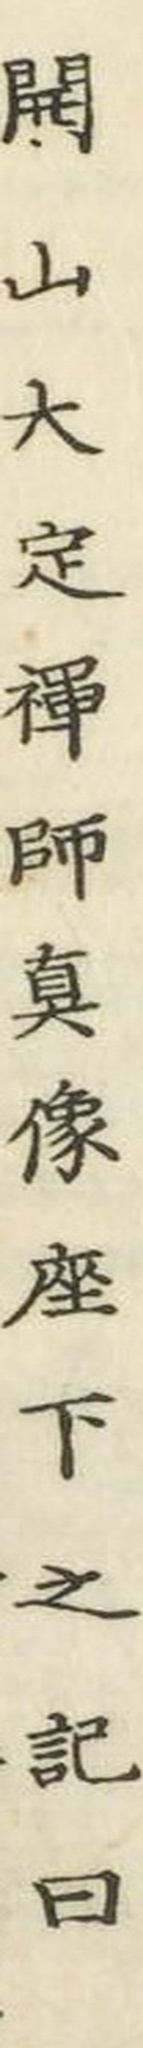開山大定禅師真像座下之記曰
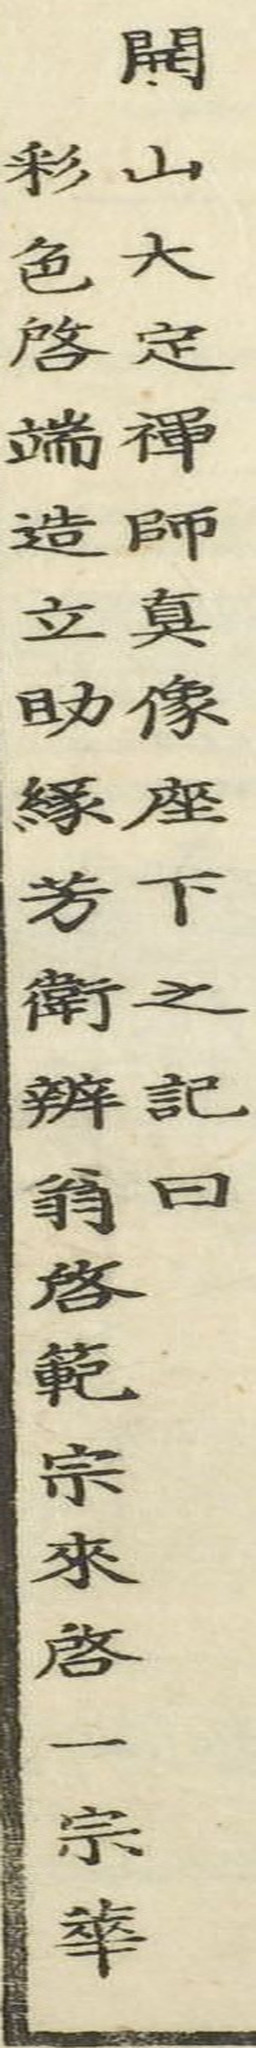彩色啓端造立助縁芳衛辨翁啓範宗来啓一宗華
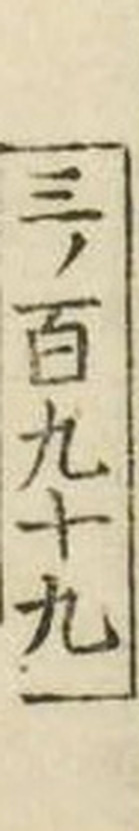三ノ百九十九
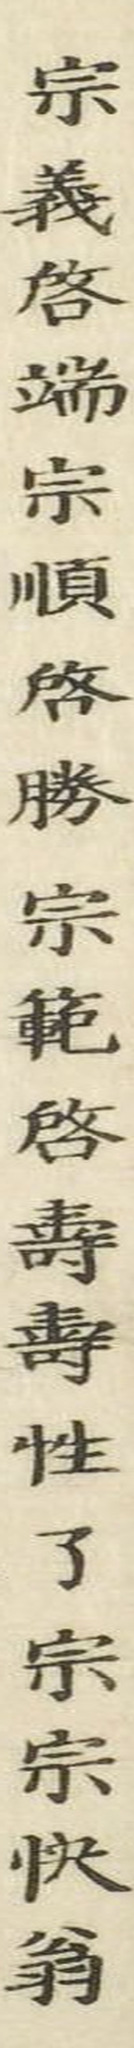宗義啓端宗順啓勝宗範啓寿寿性了宗宗快翁
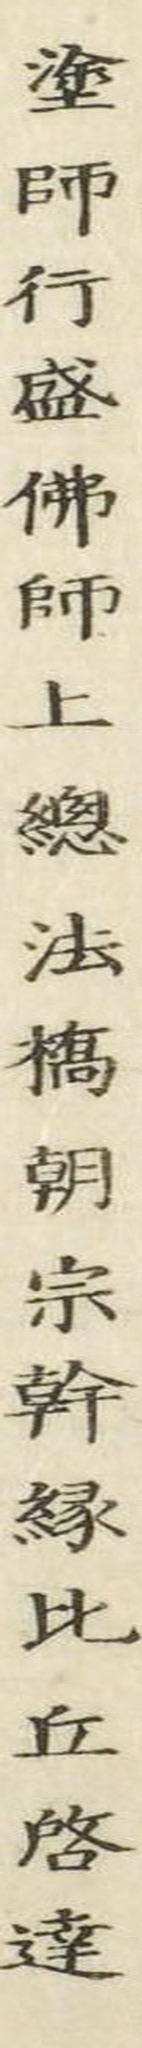塗師行盛仏師上総法橋朝宗幹縁比丘啓達
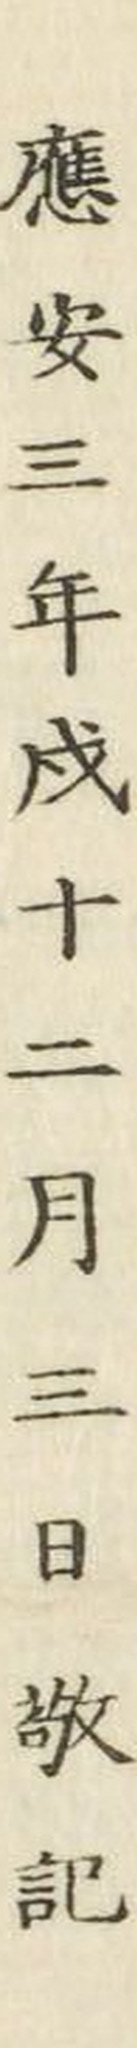応安三年戌十二月三日敬記
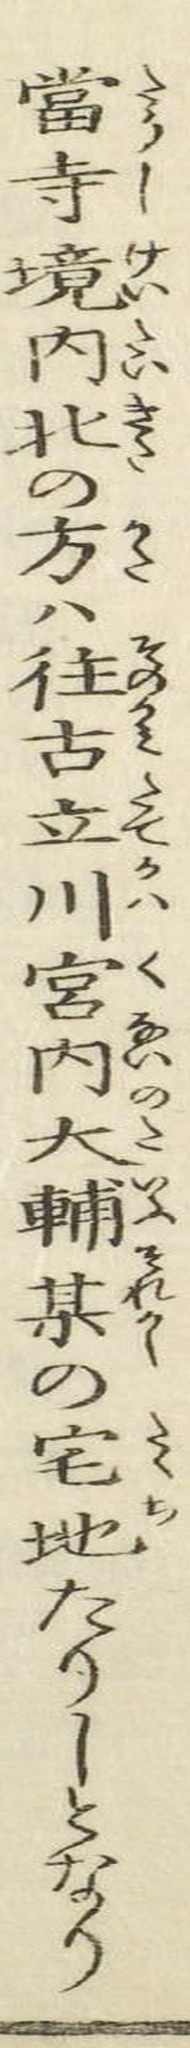当寺境内北の方は往古立川宮内大輔某の宅地たりしとなり
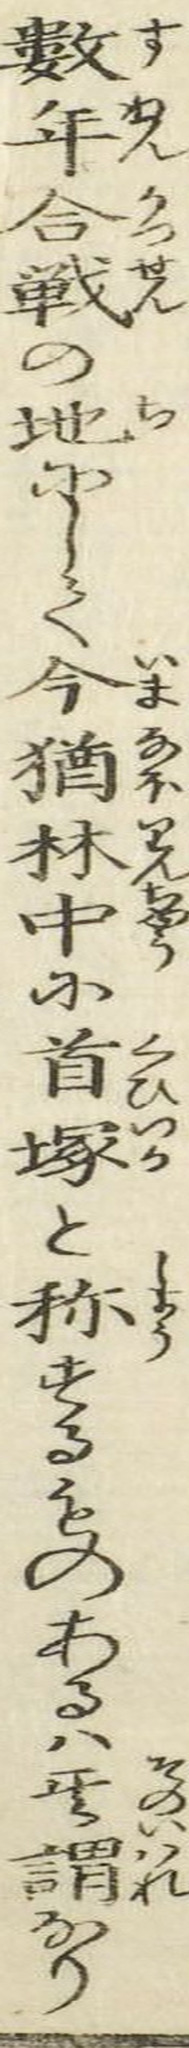数年合戦の地にして今猶林中に首塚と称するものあるは其謂なり
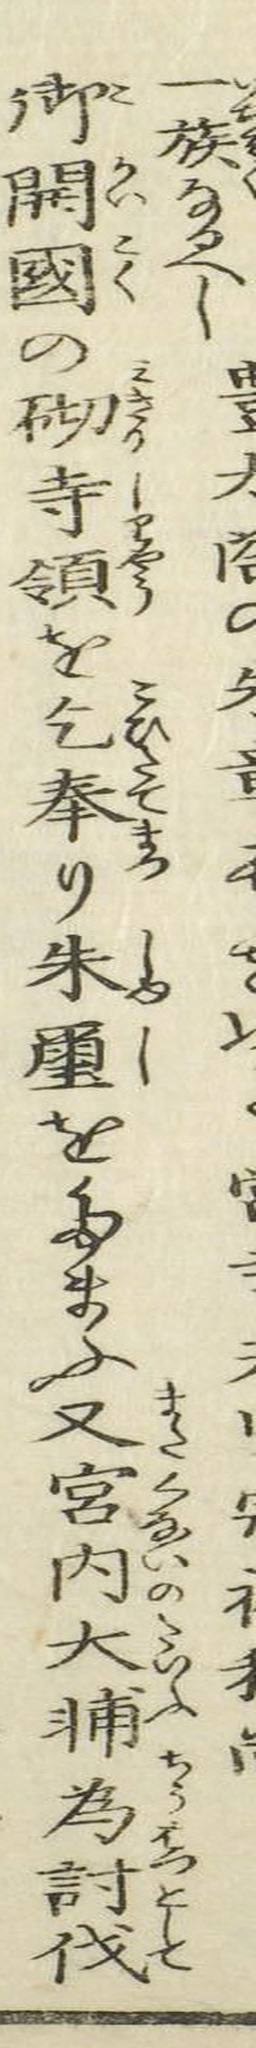御開国の砌寺領を乞奉り朱璽をたまふ又宮内大輔為討伐
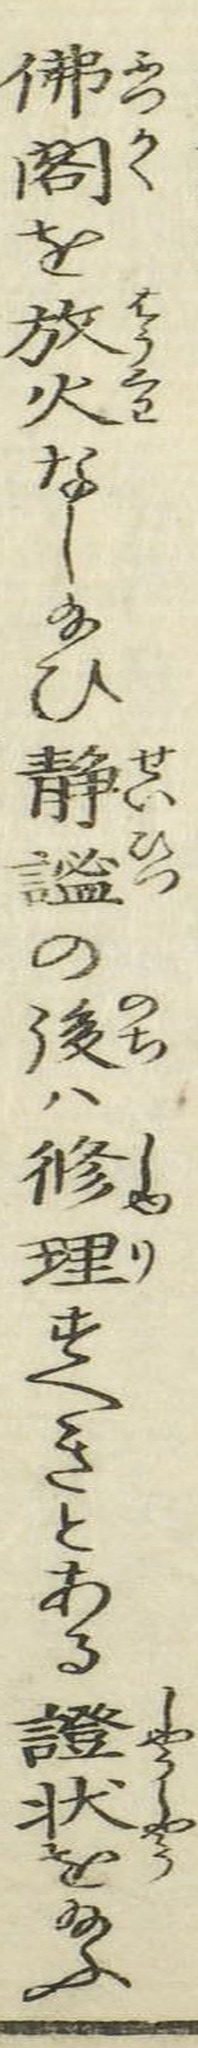仏閣を放火なし給ひ静謐の後は修理すへきとある證状を給ふ
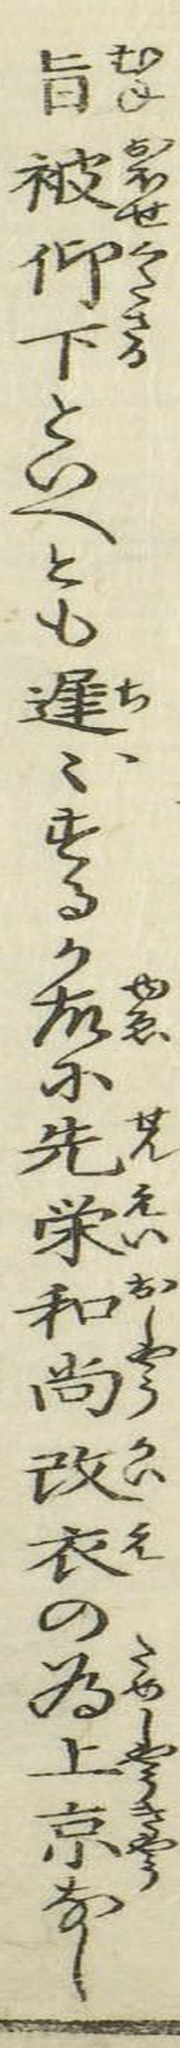旨被仰下といへとも遅々するか故に先栄和尚改衣の為上京なし
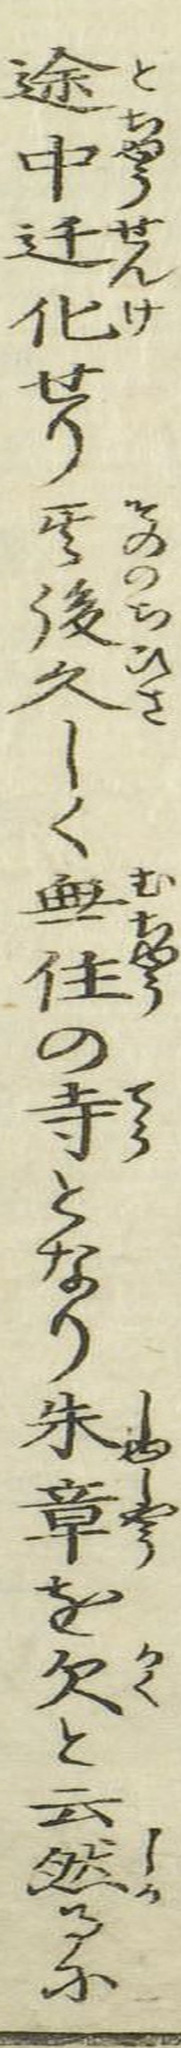途中遷化せり其後久しく無住の寺となり朱章を欠と云然るに
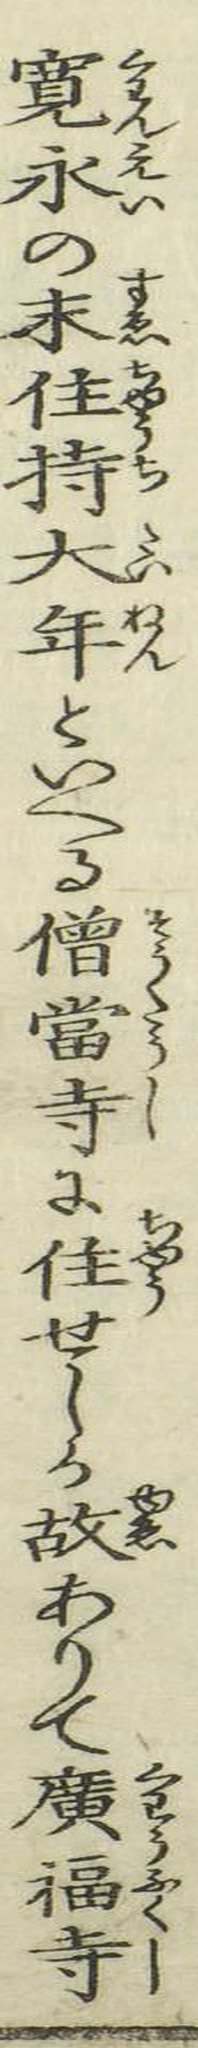寛永の末住持大年といへる僧当寺に住せしか故ありて広福寺
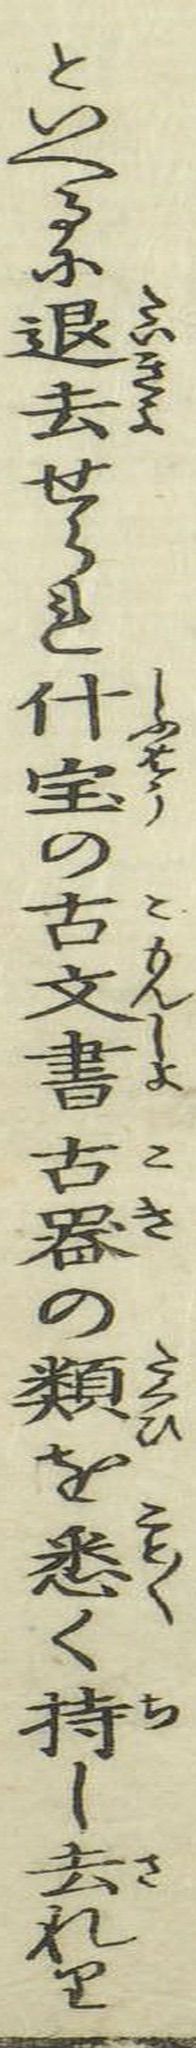といへるに退去せられ什宝の古文書古器の類悉く持し去れり
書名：江戸名所図会 20巻 巻之10
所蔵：東京学芸大学教育コンテンツアーカイブ
